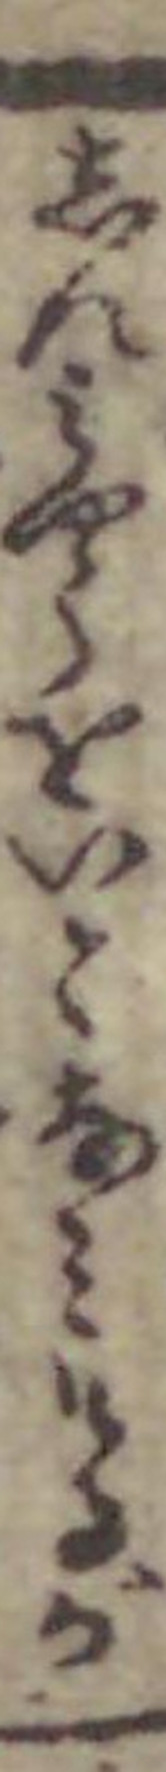しんミやうをいとなミけるが
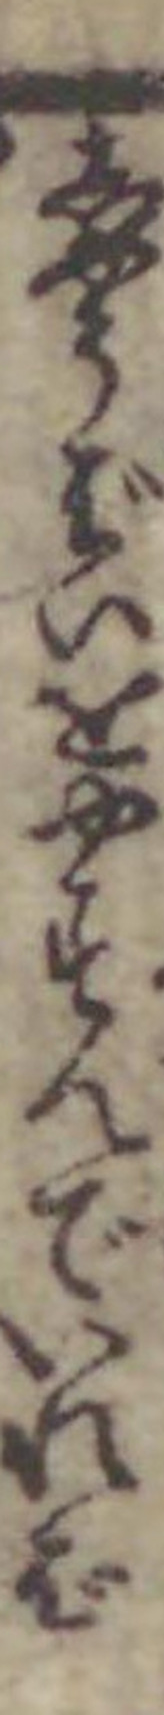しやうばいをやすんでいれば
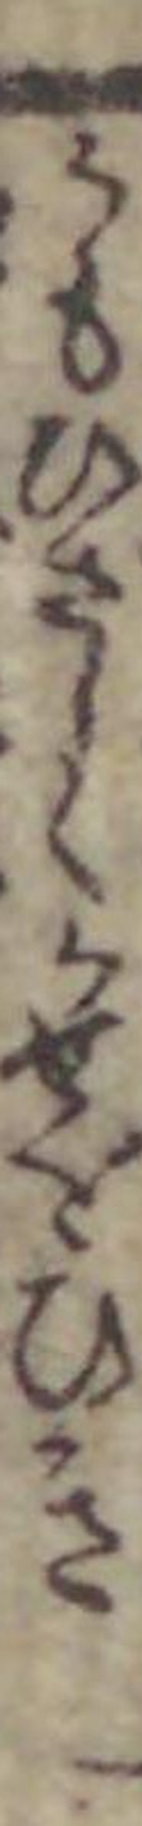うもひさしくかせをひき
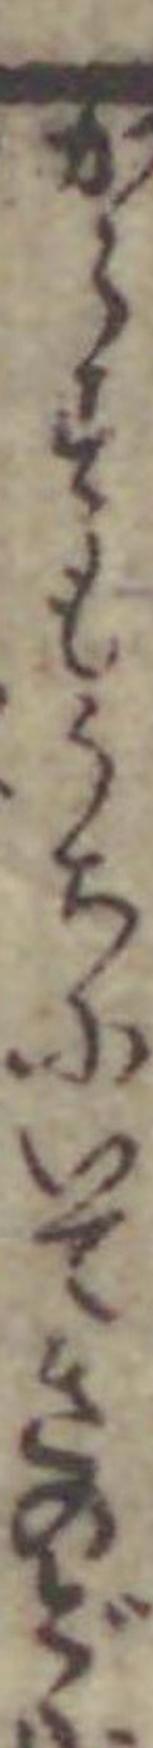からすもうちにいてきのどくに
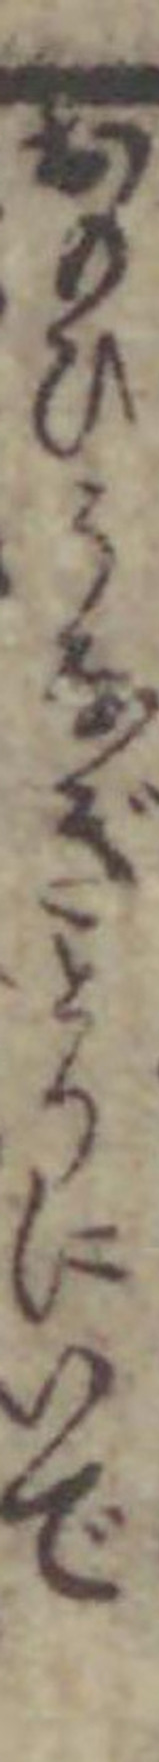おもひうなぎとりにいで
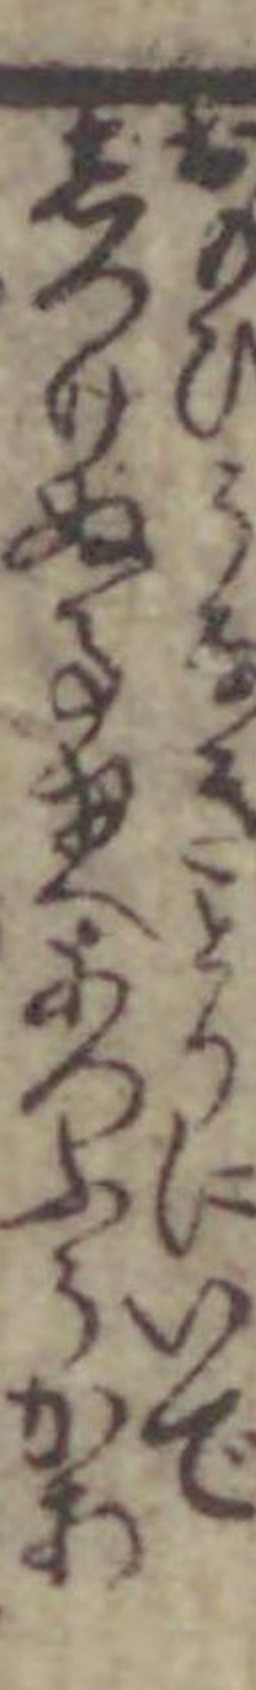しつけぬ事ゆへあつふうかあ
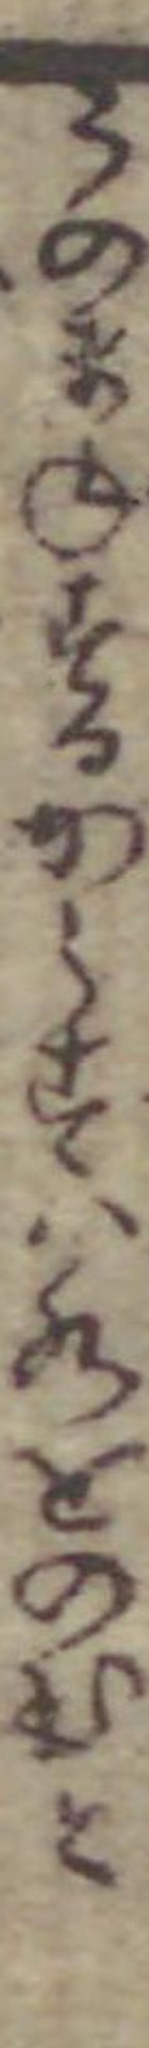うのまねするからすハ水をのむと
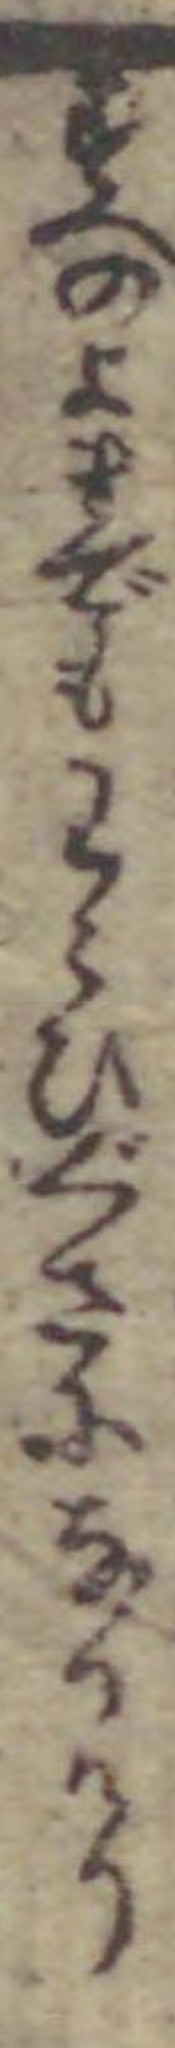すへのよまでもわらひぐさになりけり
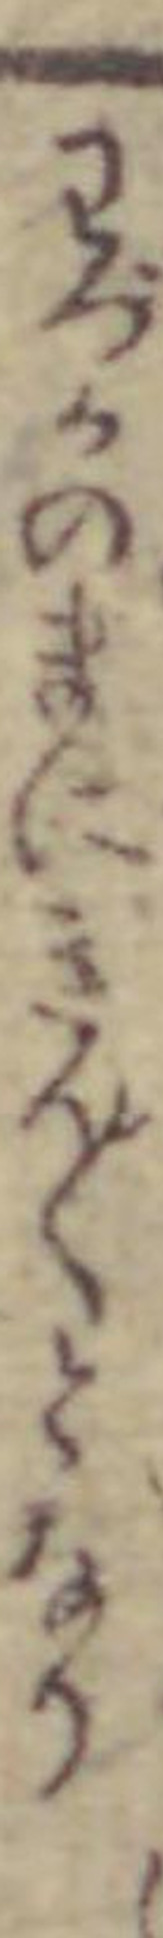わづかのまにきん〳〵となり
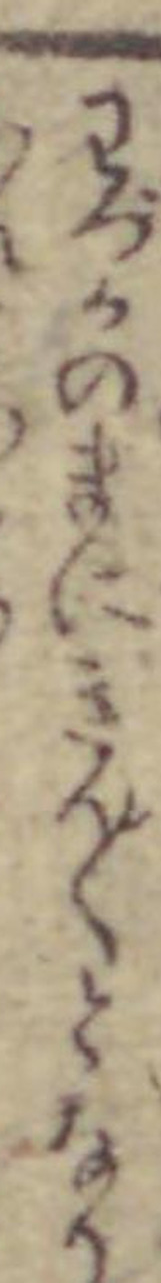わづかのまにきん〳〵となり
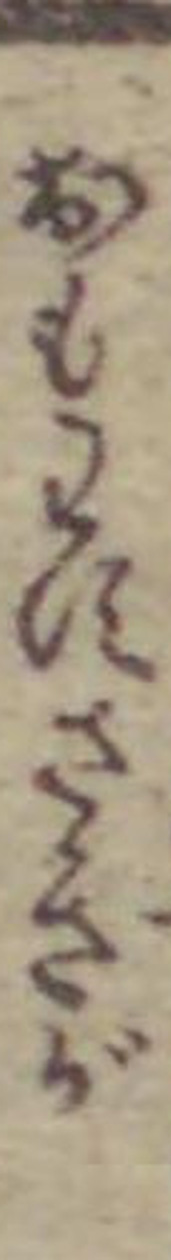おもわすさきが
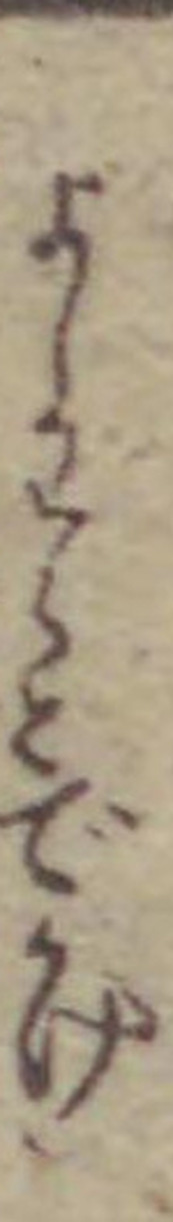よしわらとでかけ
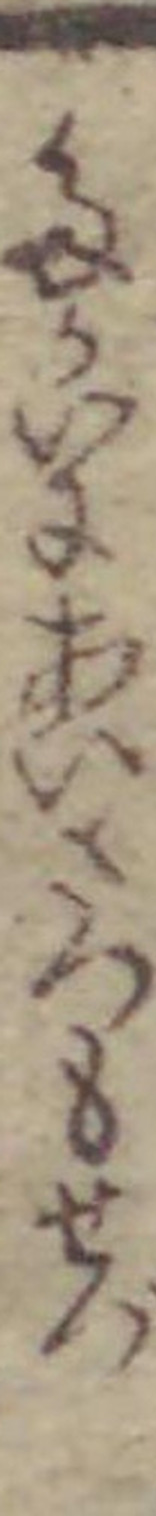たかいにあいさつもせづ
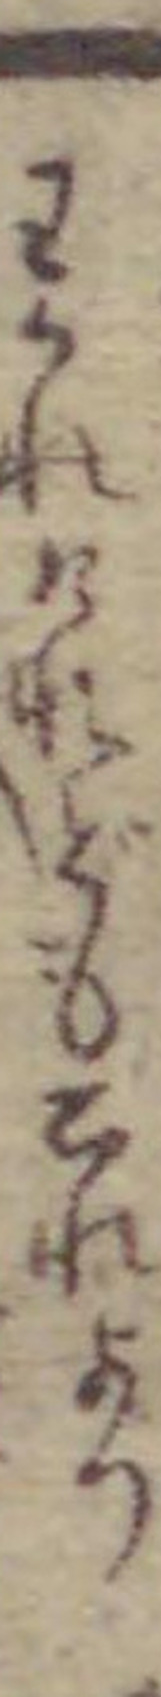わかれけれどもこれより
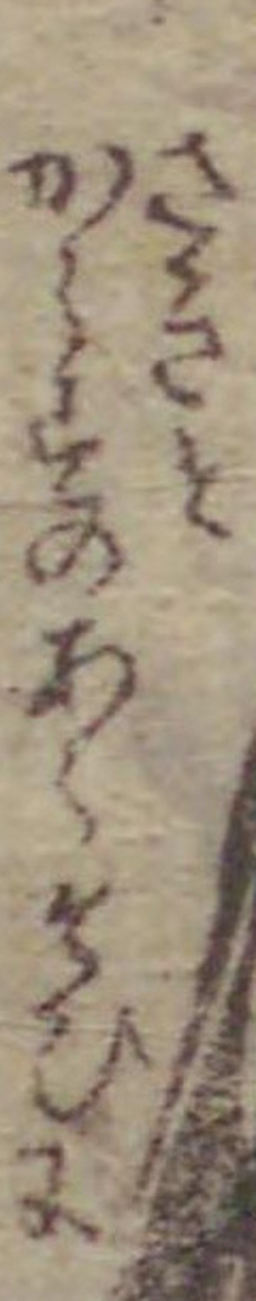からすのあらそひに
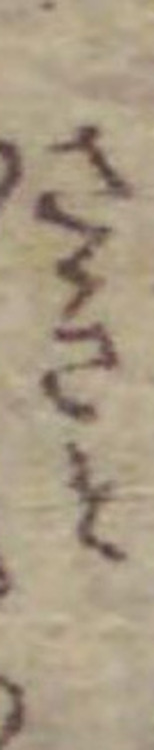さきと
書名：烏行水諺草 3巻
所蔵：国立国会図書館 National Diet Library, JAPAN
